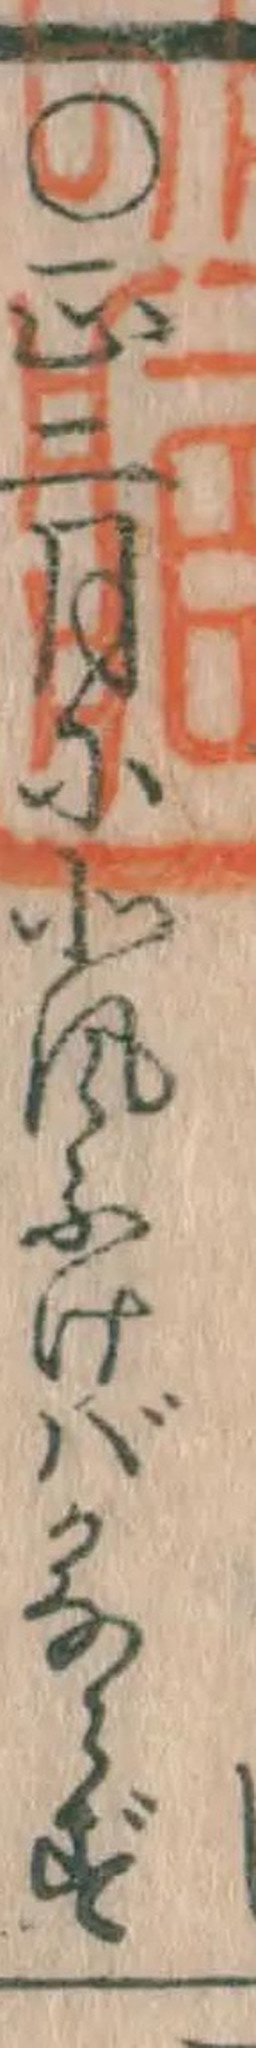○正二月に北風ふけばかならず
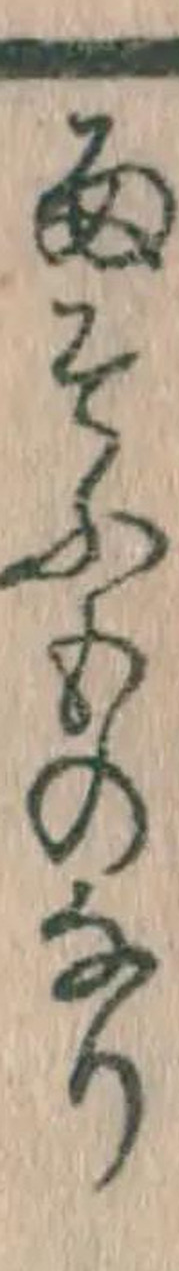雨そふものなり
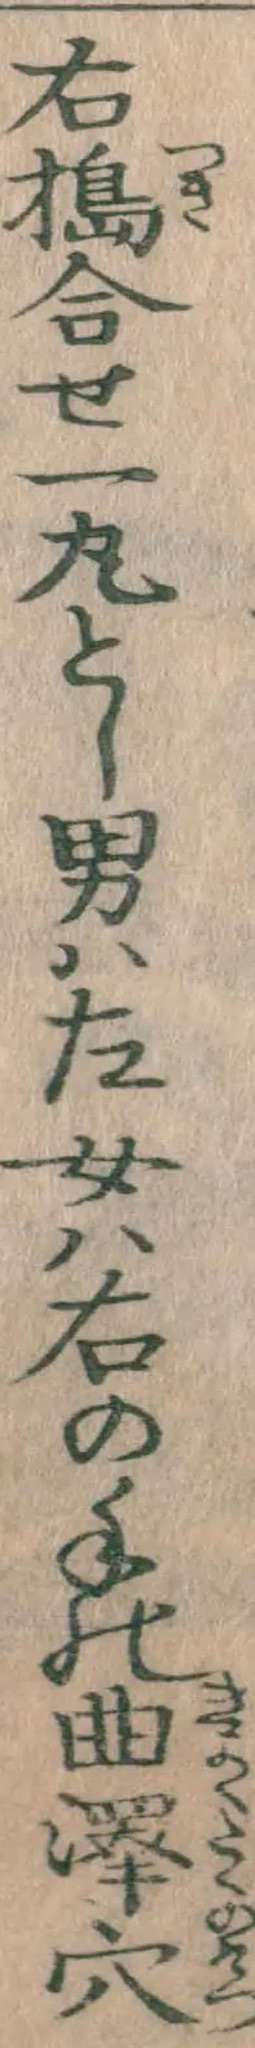右搗合せ一丸とし男は左女は右の手の曲沢穴
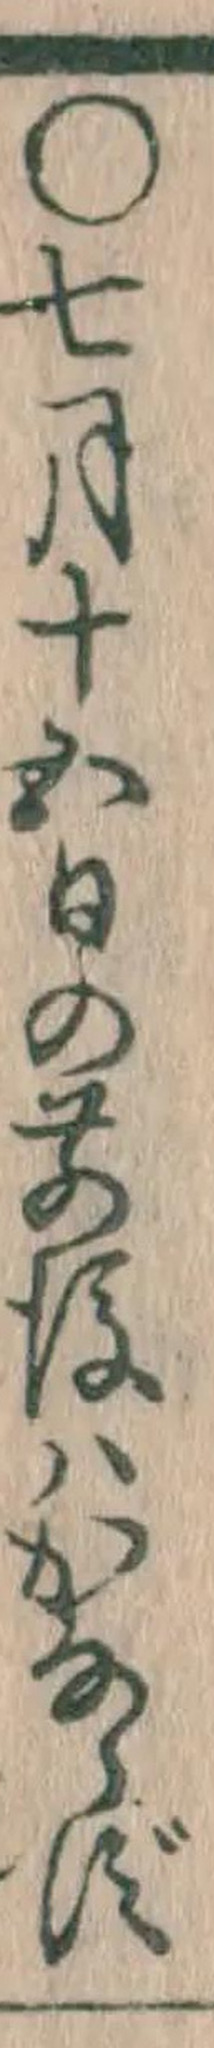○七月十五日の前後はかならず
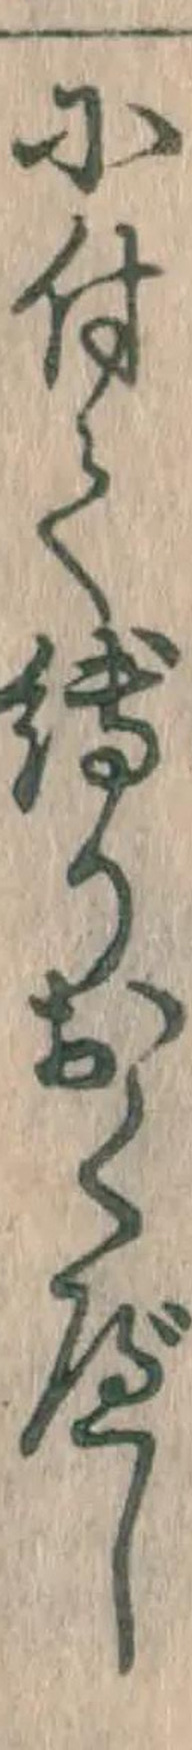に付て縛りおくべし
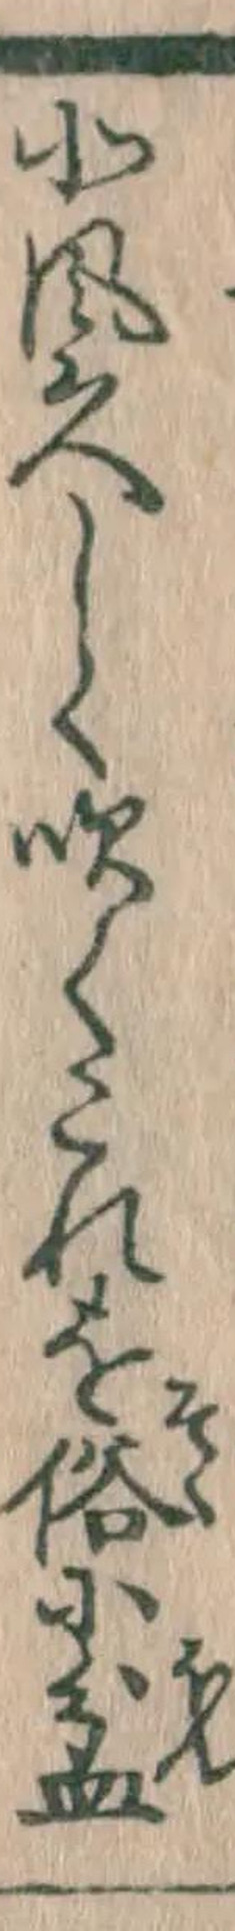北風久しく吹くこれを俗に盆
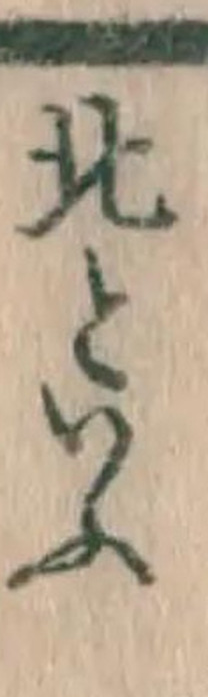北といふ
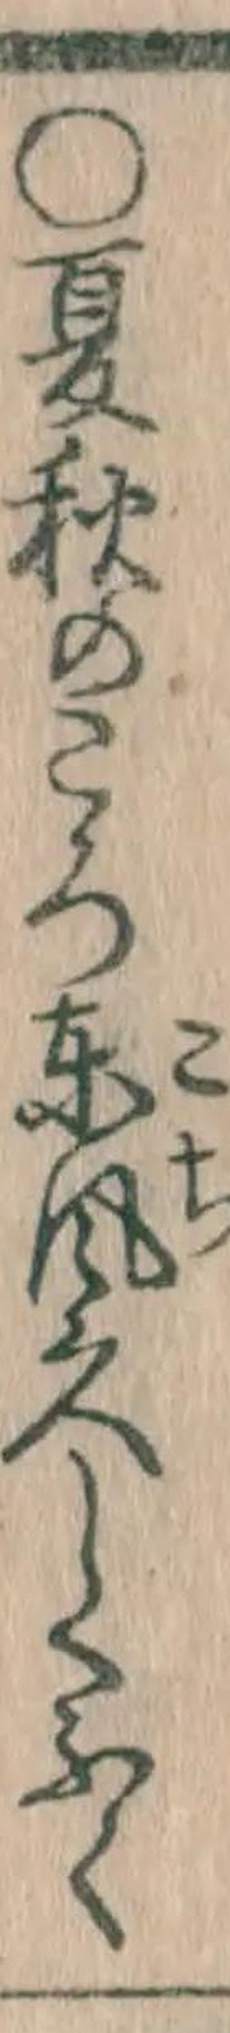○夏秋のころ東風久しくふく
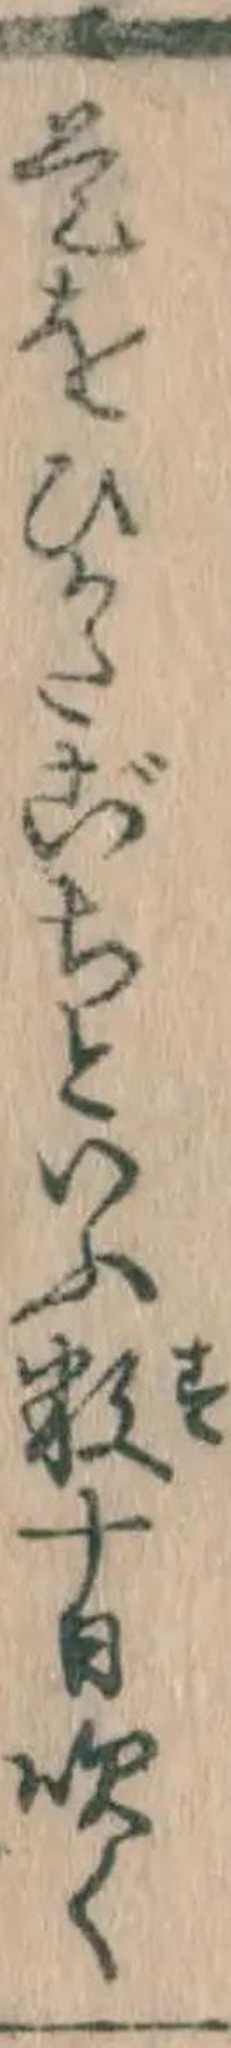是をひかたごちといふ数十日吹く

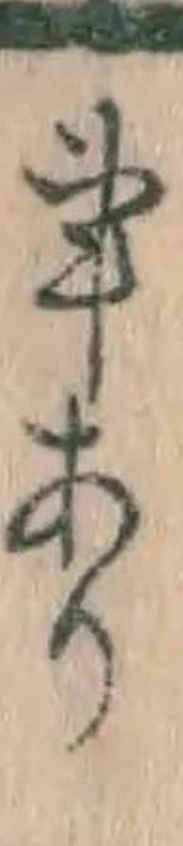事あり
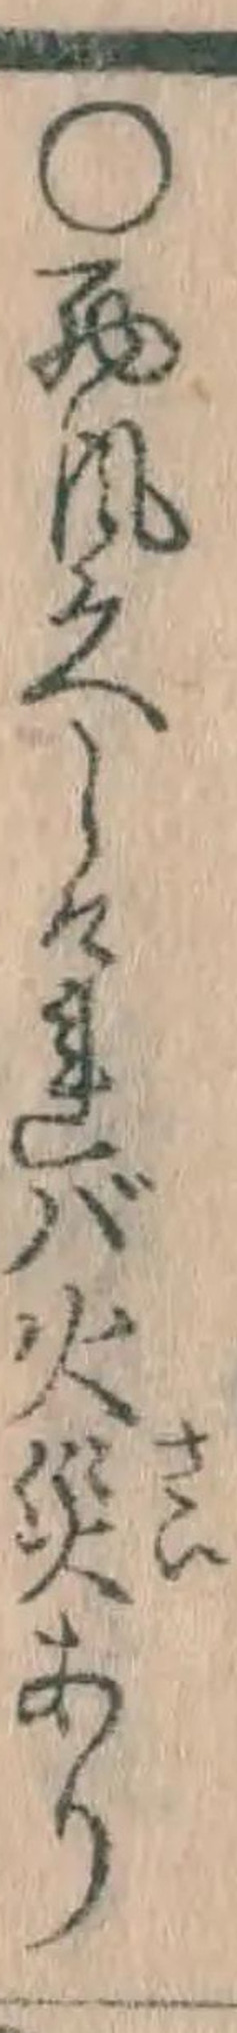○西風久しければ火災あり
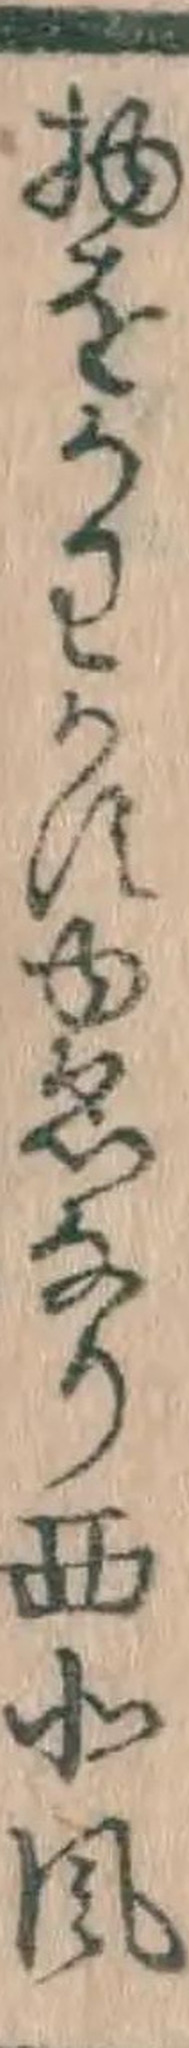物をかわかすゆゑなり西北風
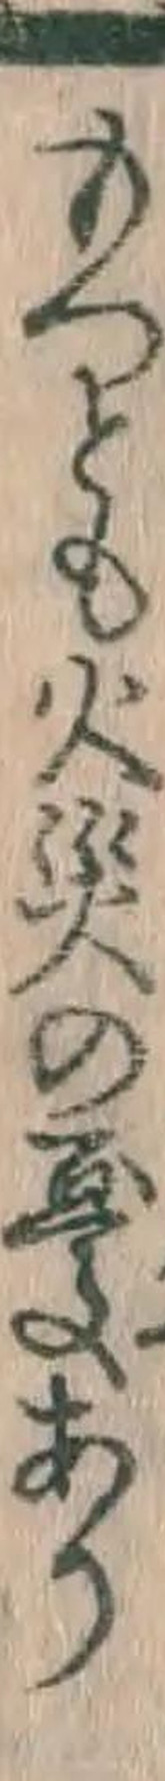もつとも火災の憂あり
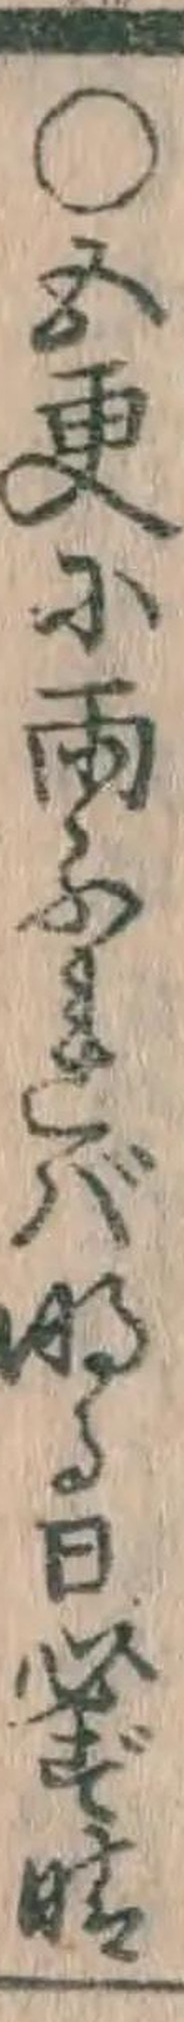○五更に雨ふれば明る日必ず晴
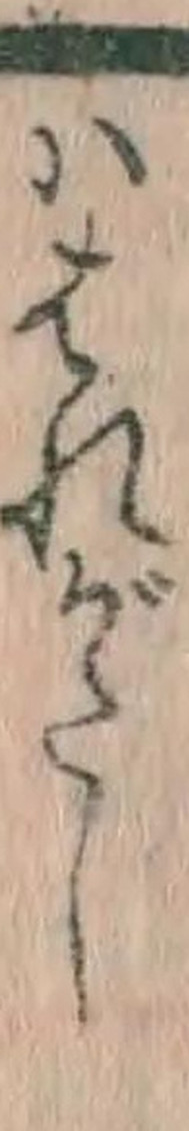ははれがたし
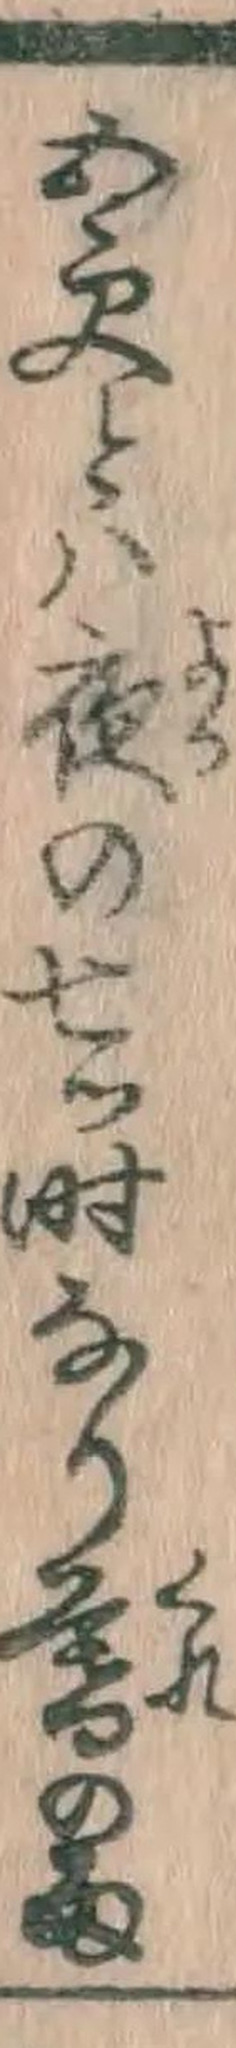五更とは夜の七ッ時なり暮の雨
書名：広益秘事大全 3巻. [4]
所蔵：国立国会図書館 National Diet Library, JAPAN
